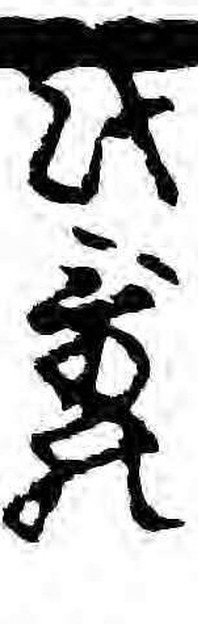此哥の
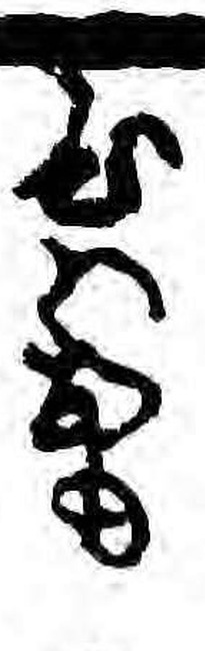心はおも
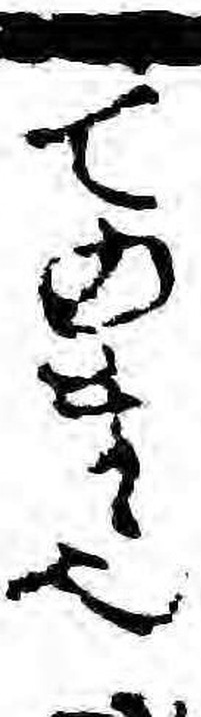てのまゝ也
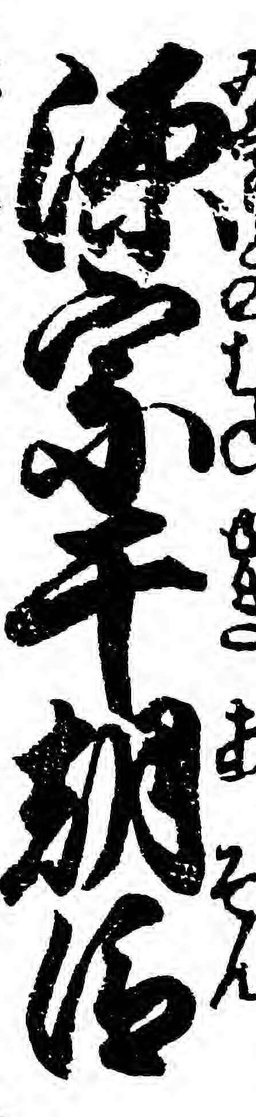源宗于朝臣
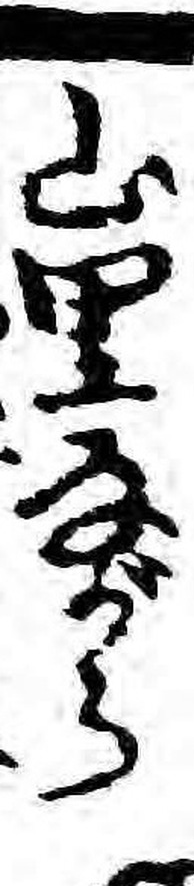山里ながら
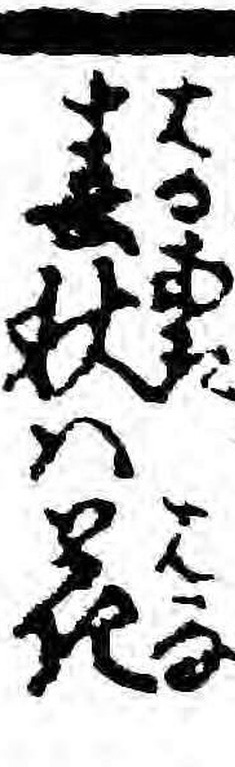春秋は花
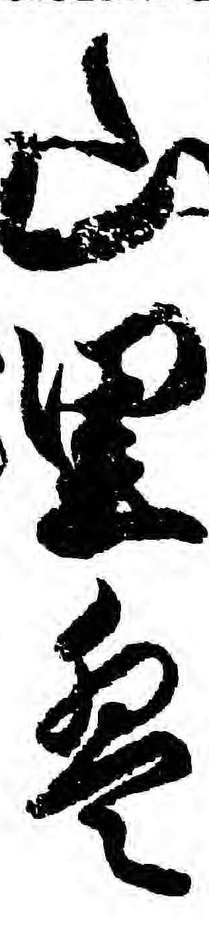山里は
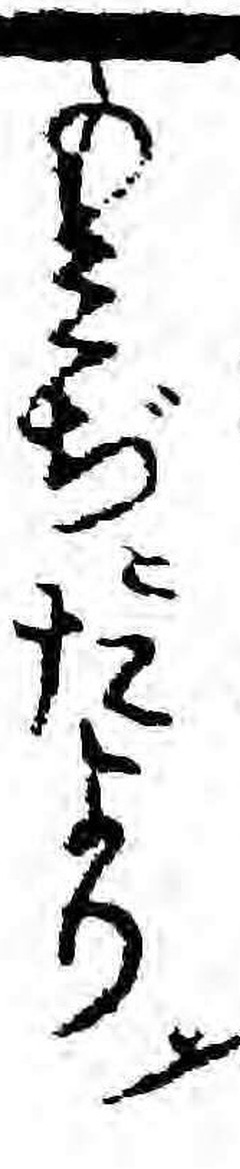もみぢにたより
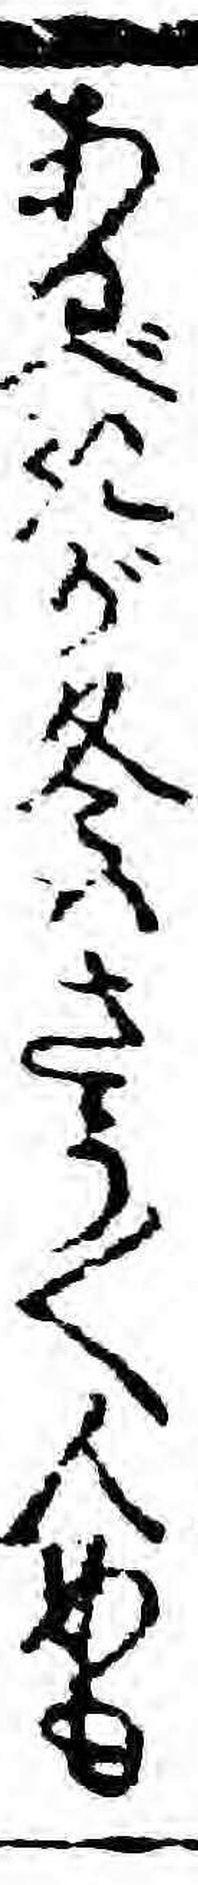あるべきが冬はさう〳〵人めも
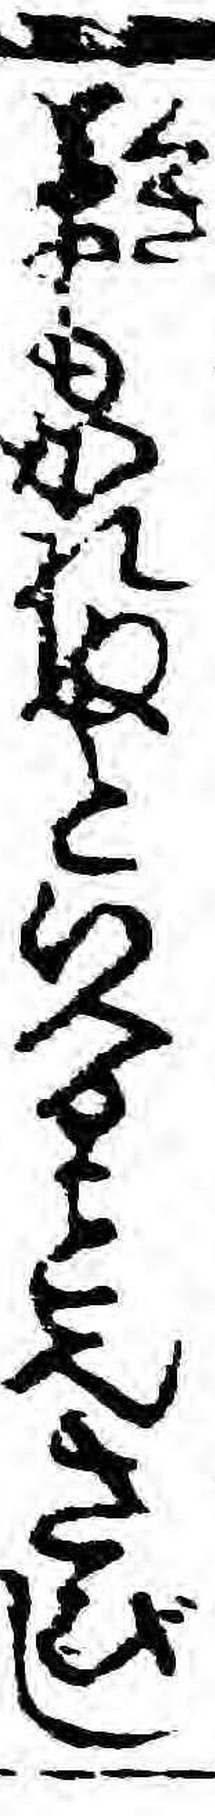草もかれぬといへること也さびし
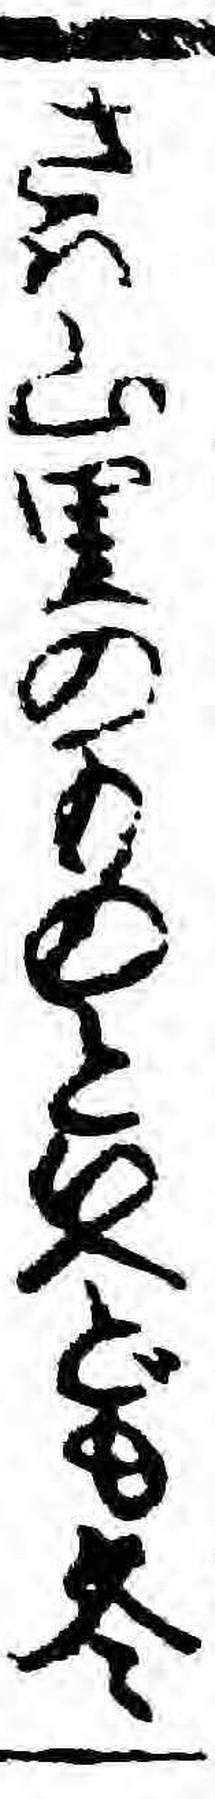さは山里のものといへども冬
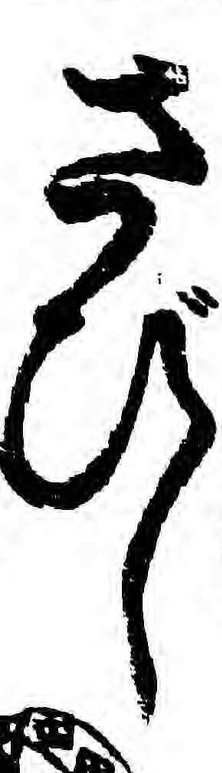さびし
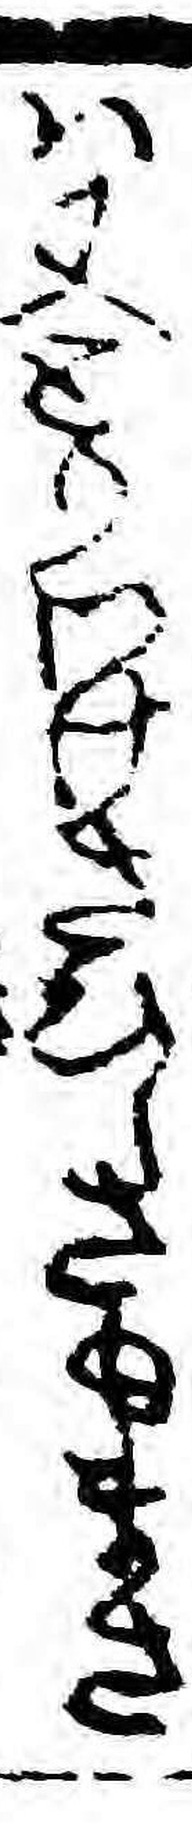は又とりわけさびしさもまさ
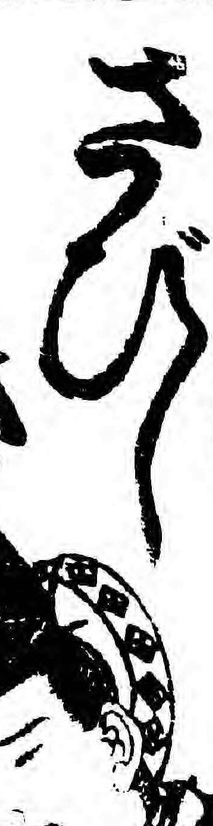さびし
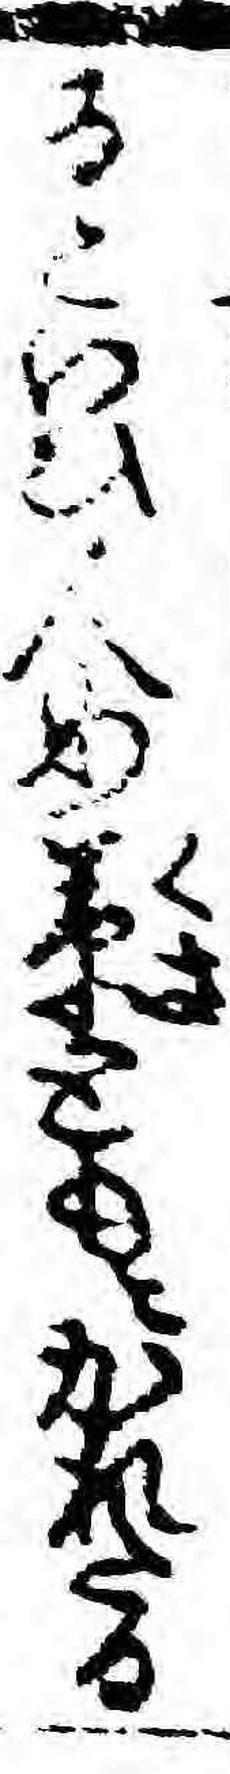るといひ人め草ともにかれたる
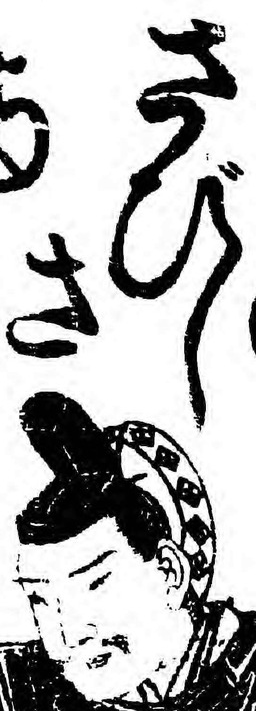さびし
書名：頭書和歌注譯／壽賀多百人一首小倉錦
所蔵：国文学研究資料館
